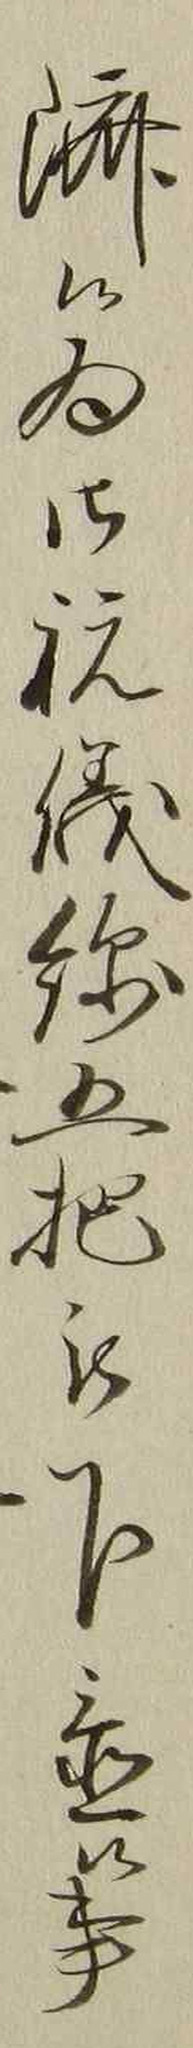済候為御祝儀綿五把被下置候事
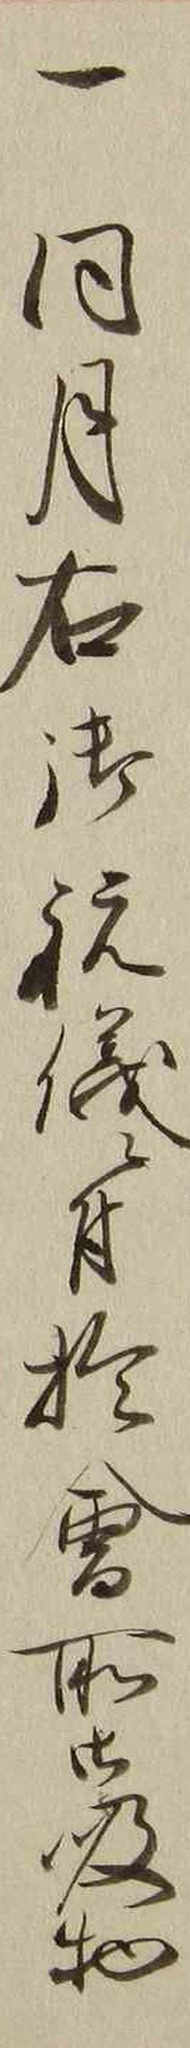一同月右御祝儀に付候於会所御吸物
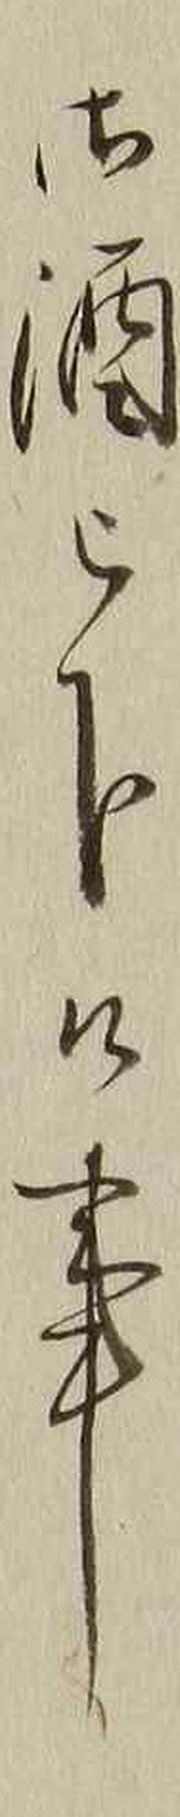御酒被下候事
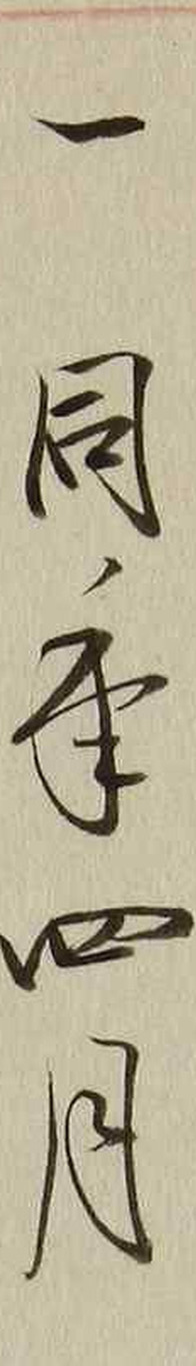一同年四月
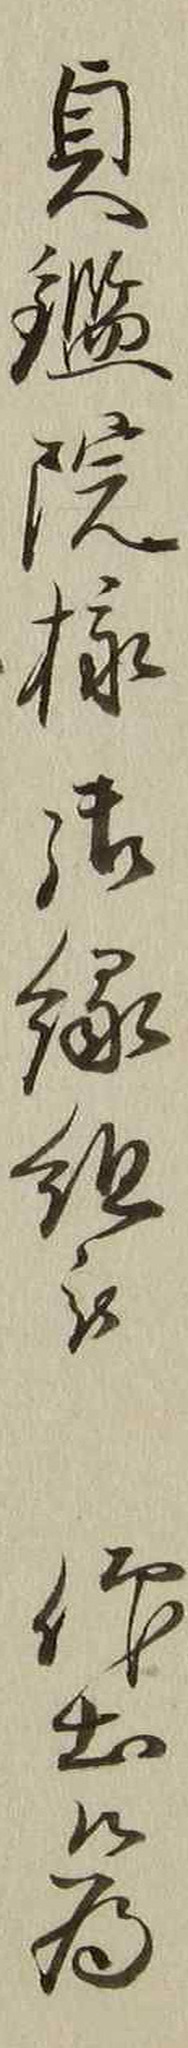貞鑑院様御縁組被仰出候為
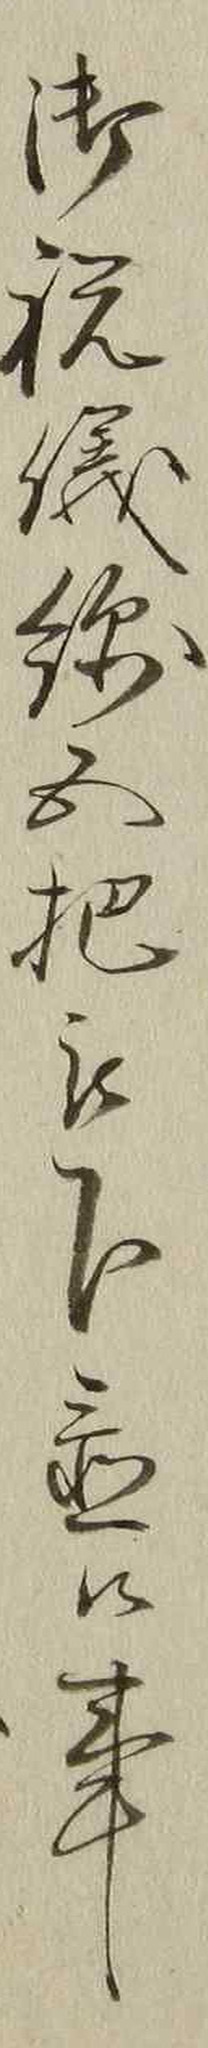御祝儀綿五把被下置候事
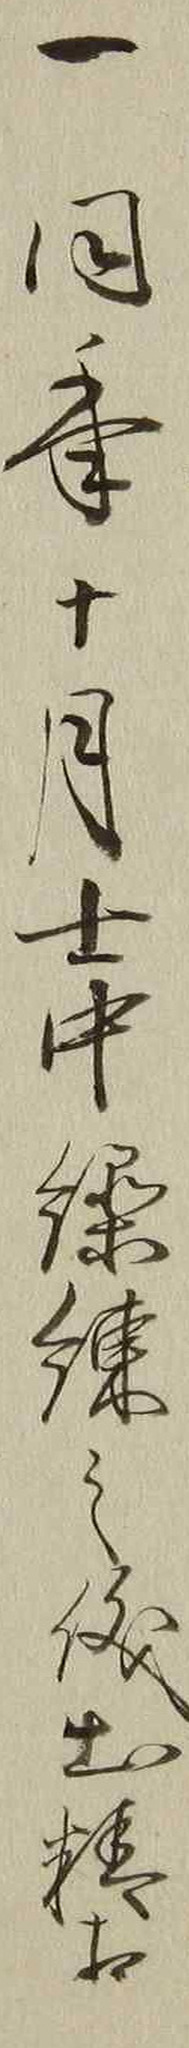一同年十月士中繰錬之儀出精相
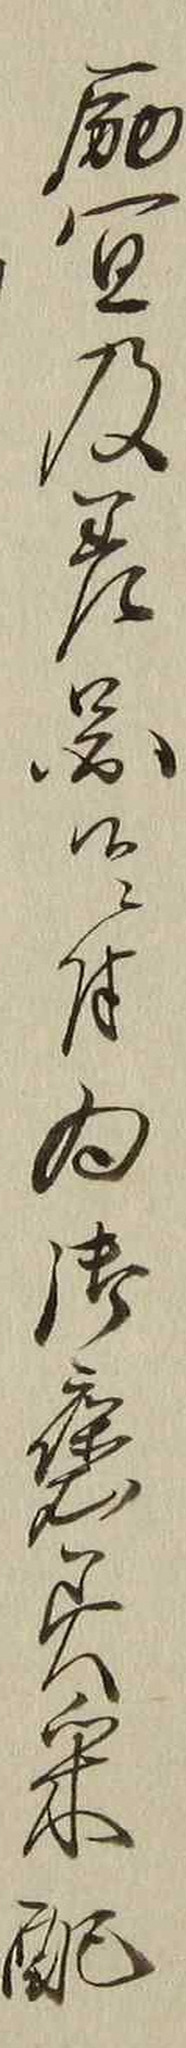励宜及差図候に付為御褒美采配
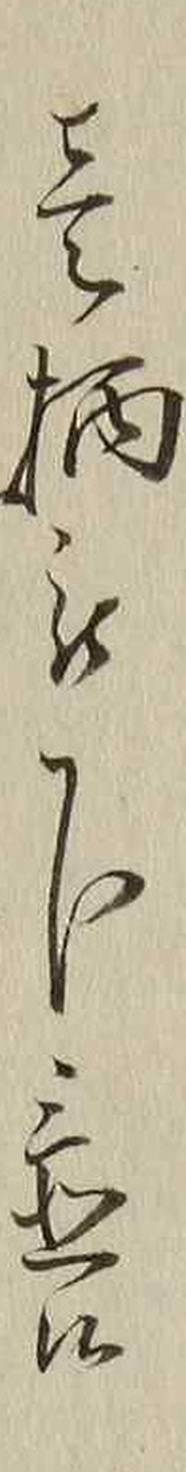壱柄被下置候
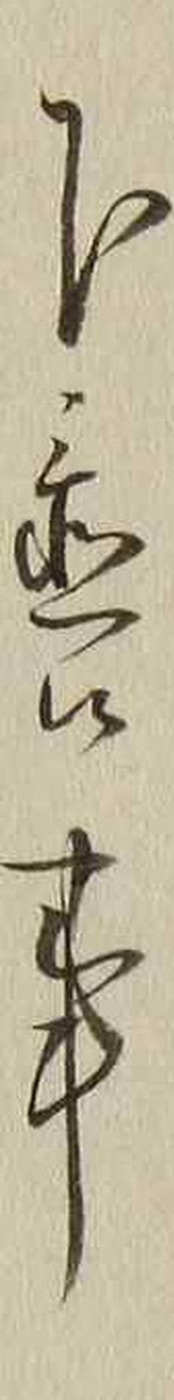下置候事
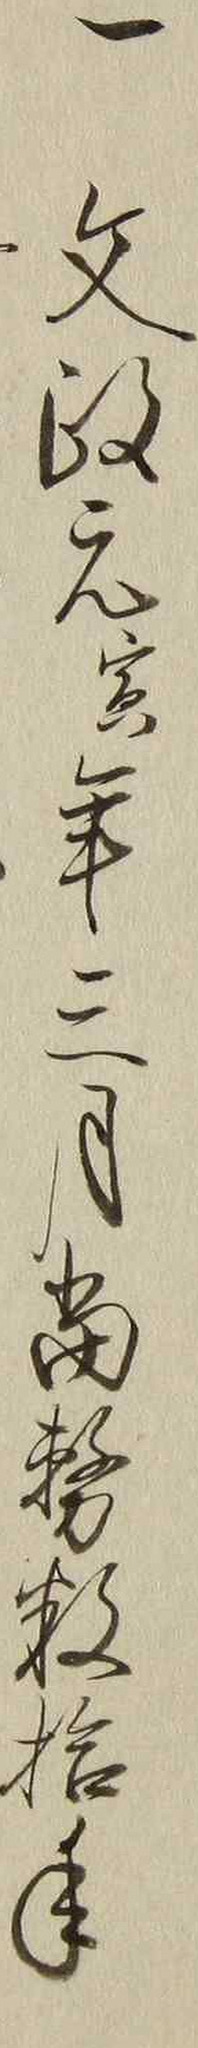一文政元寅年三月当務数拾年
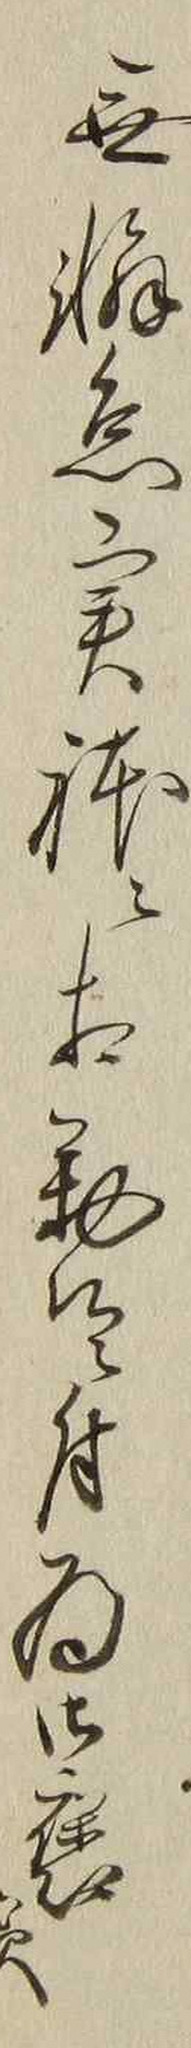無懈怠実体に相勤候に付為御褒美
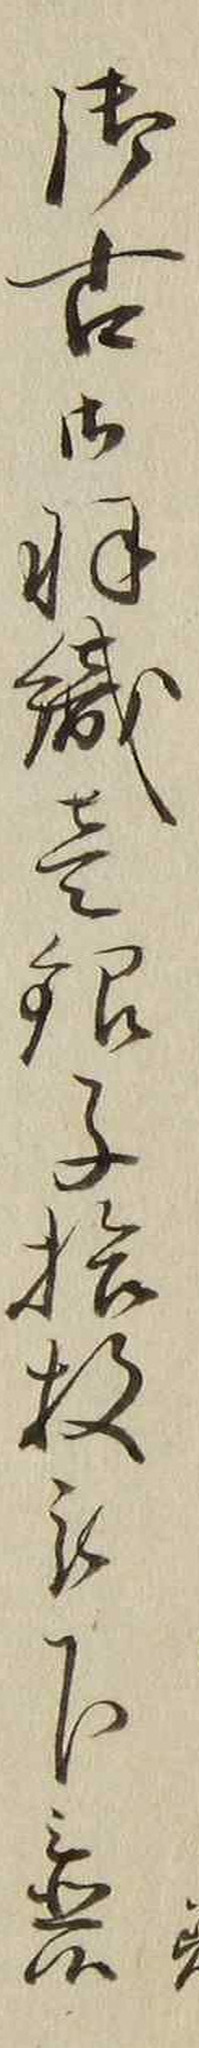御古御羽織壱銀子拾枚被下置候
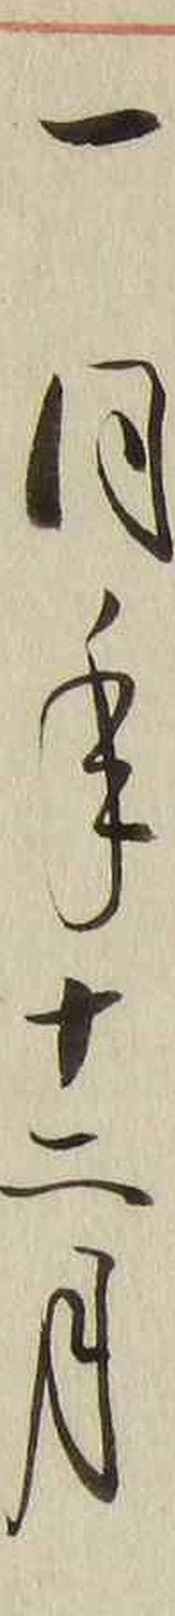一同年十二月
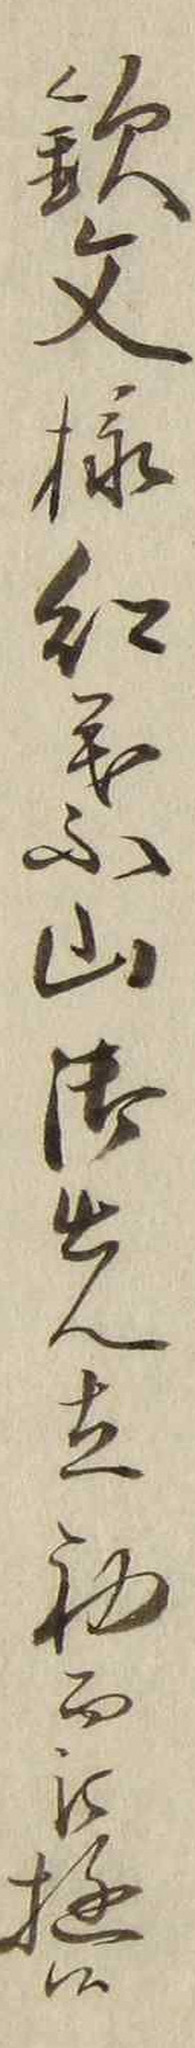欽文様紅葉山御先立初而被遊候

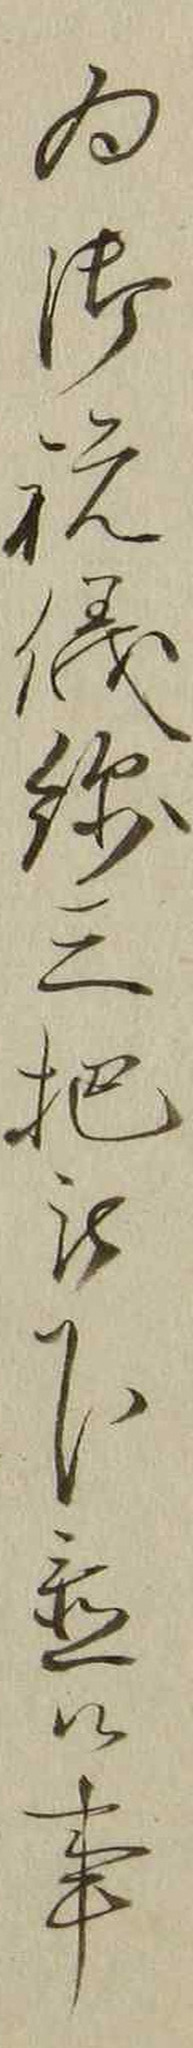為御祝儀綿三把被下置候事
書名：諸士系譜　巻之103　か之部11
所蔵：会津若松市立会津図書館
